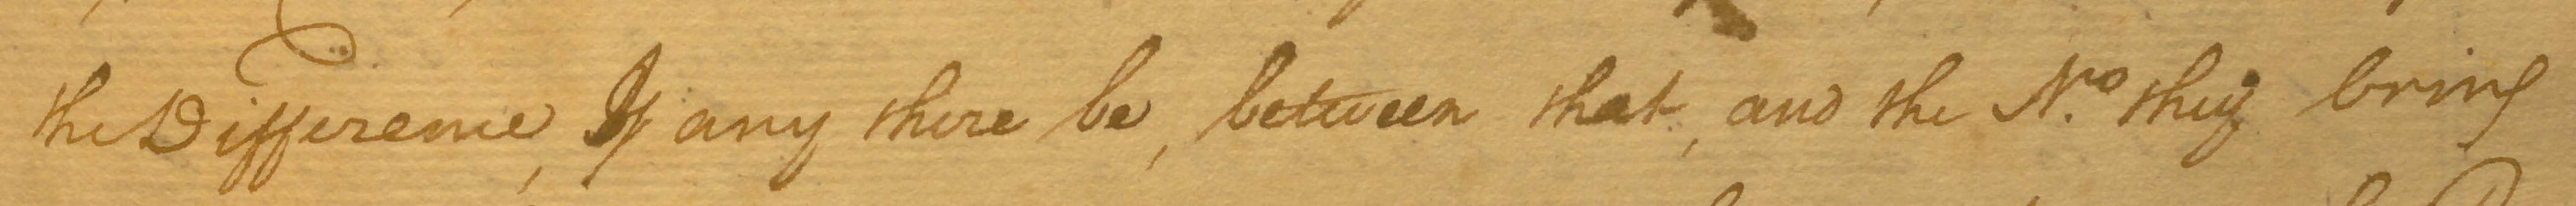the Difference, If any there be, between that and the N^o. they bring
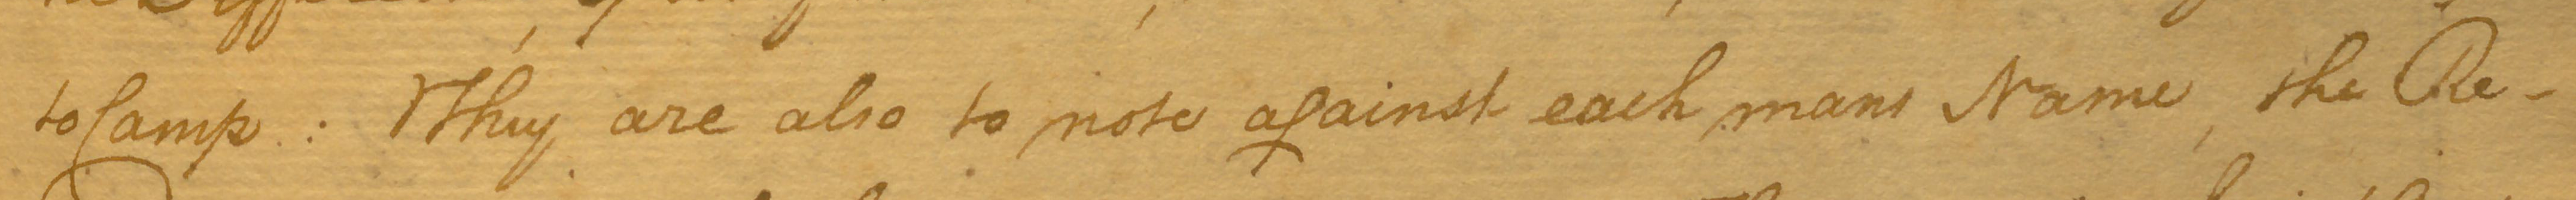to Camp: They are also to note against each mans Name the Re-
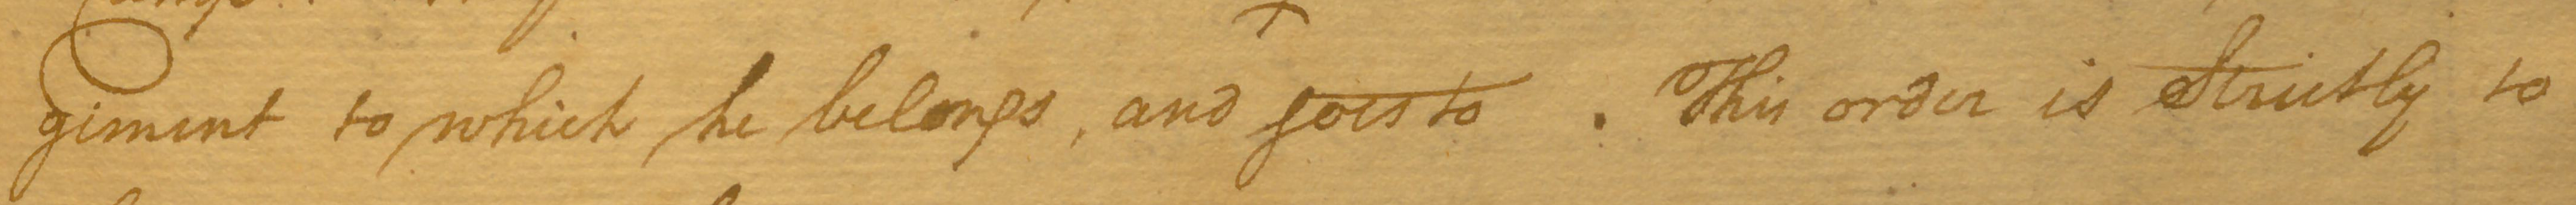giment to which he belongs, and goes to. This order is Strictly to
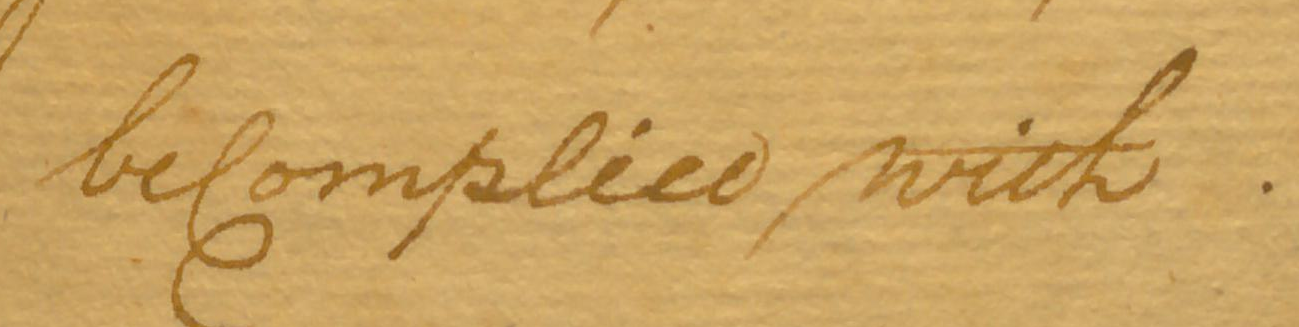be Complied with.
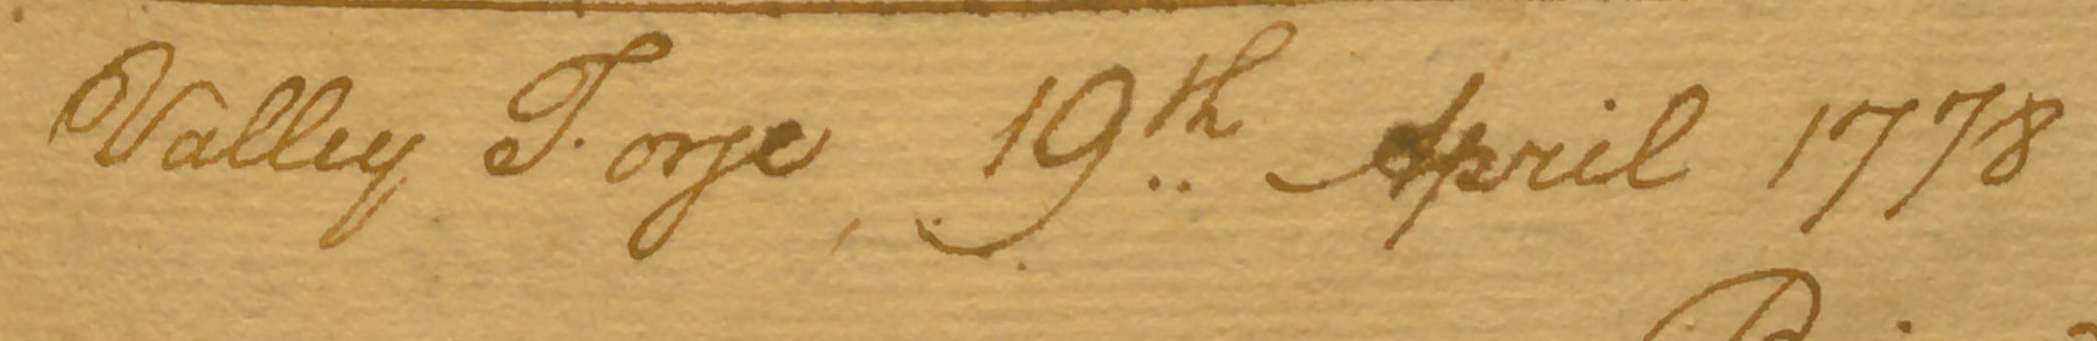Valley Forge 19^th. April 1778
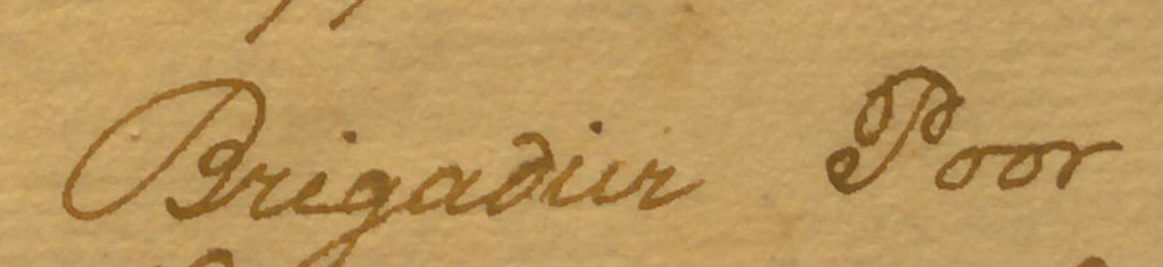Brigadier Poor
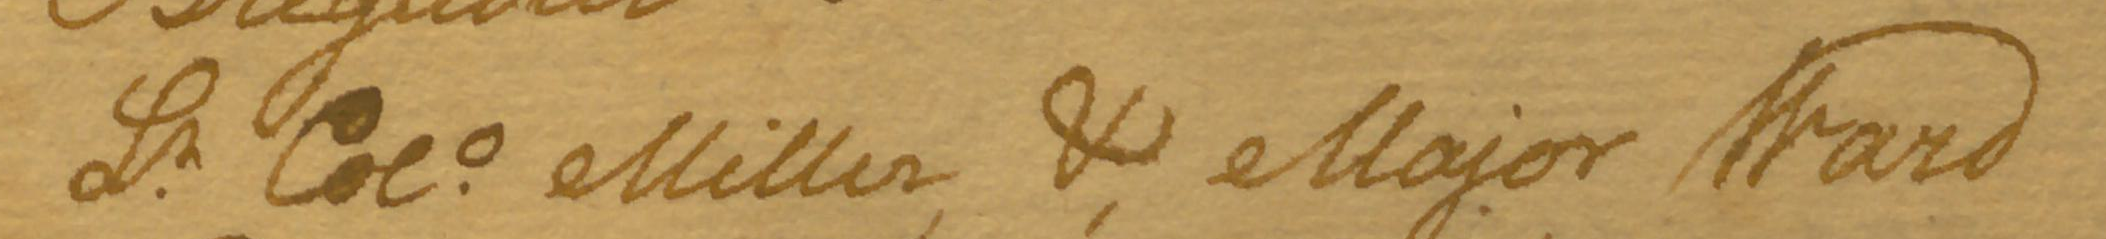L^t. Col^o. Miller & Major Ward
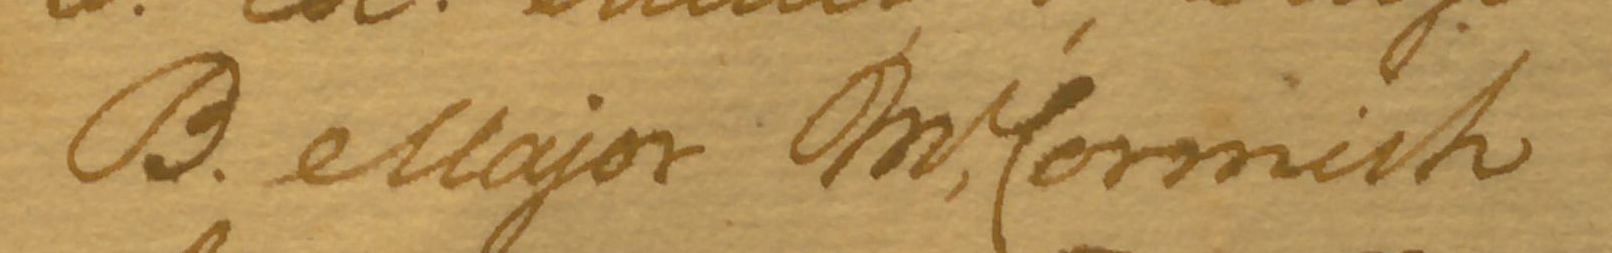B. Major M^c.Cormick
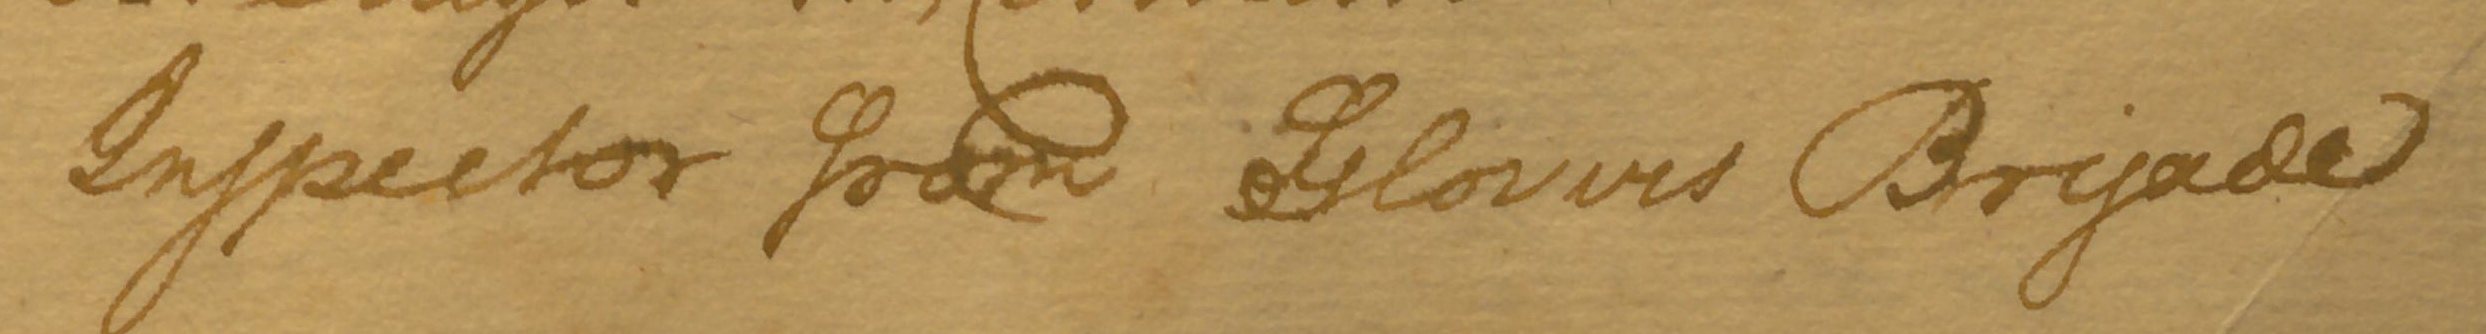Inspector from Glovers Brigade
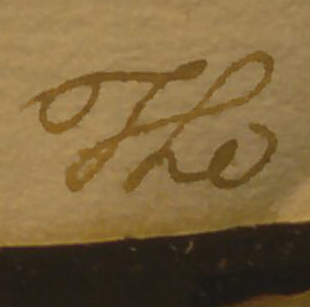The
